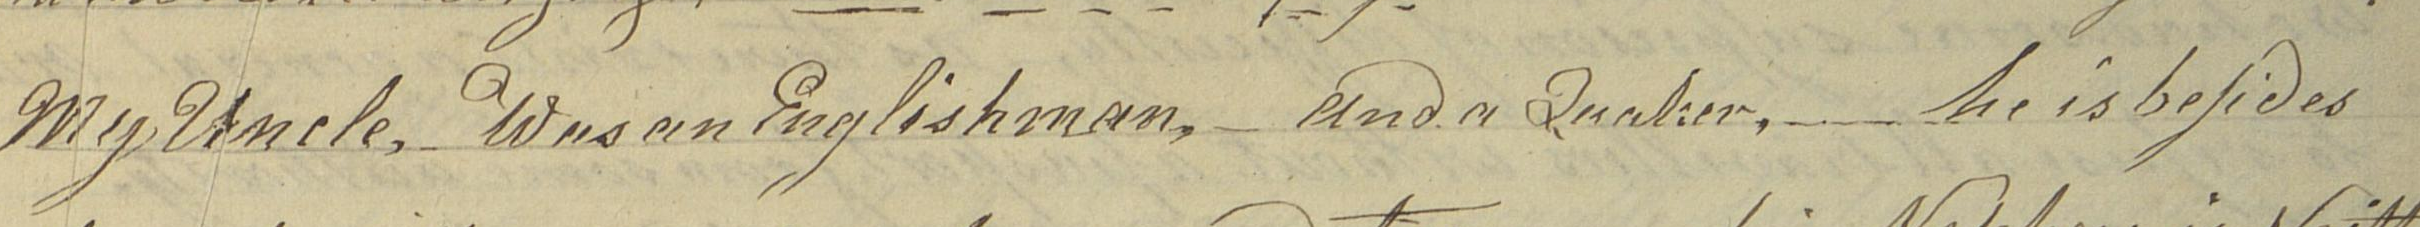My Uncle, Was an Englishman, and a Quaker, he is besides
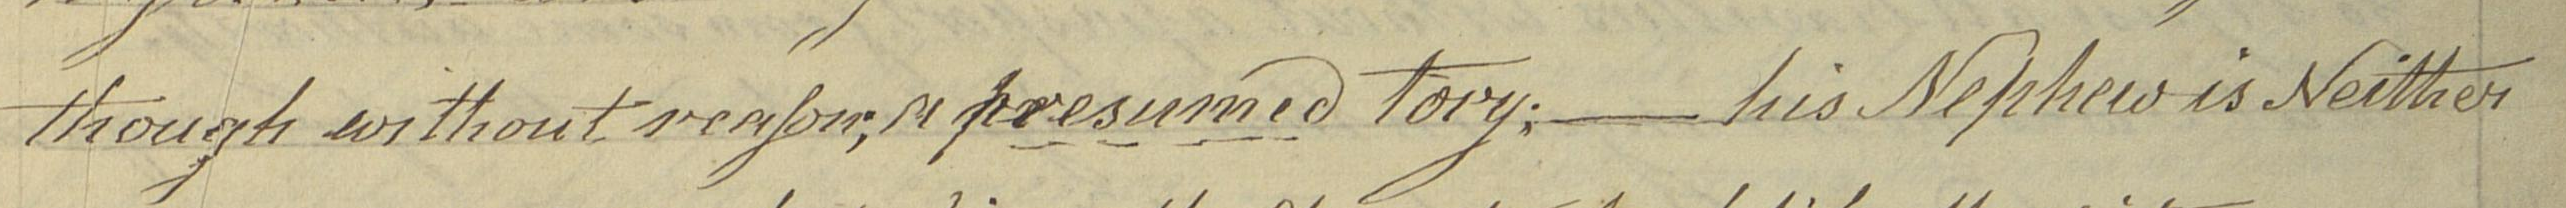though without reason a presumed tory. his Nephew is Neither
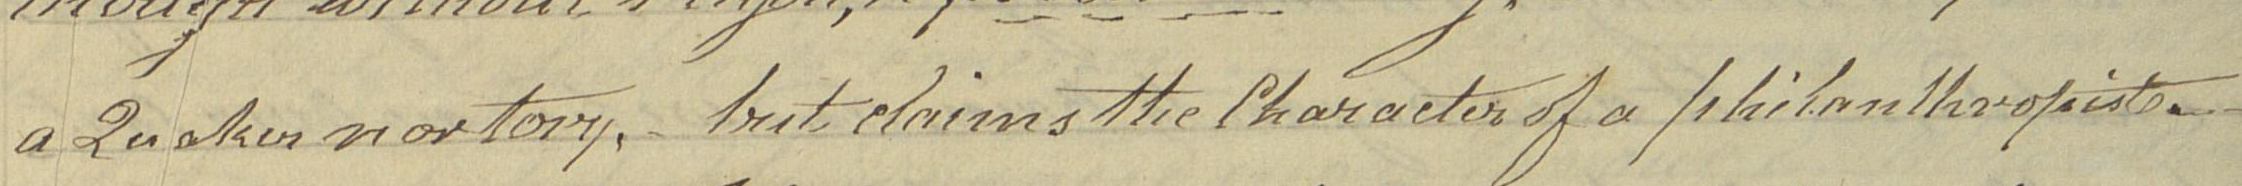a Quaker nor tory. but claims the Character of a philanthropists
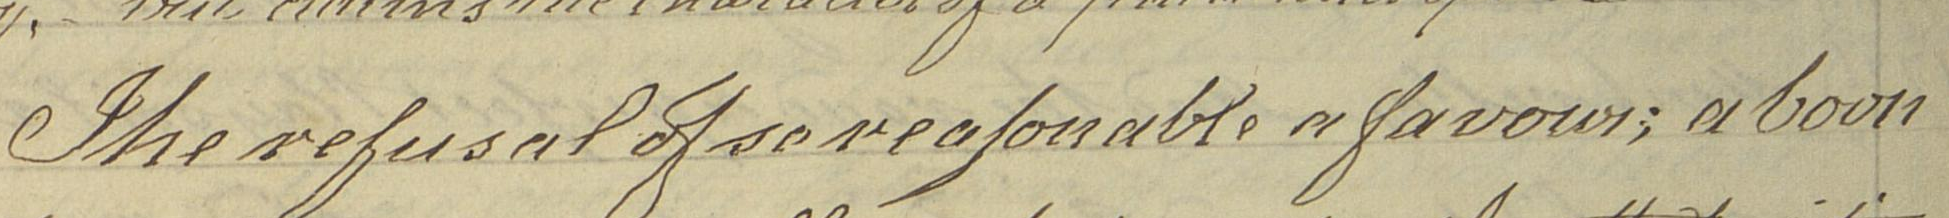The refusal of so reasonable a favour; a boon
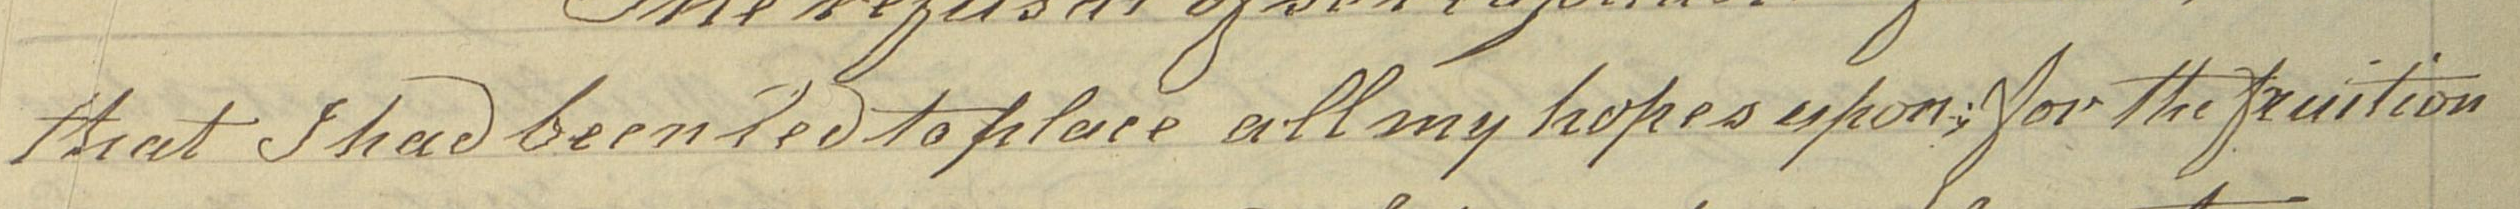that I had been led to place all any hopes upon for the fruition
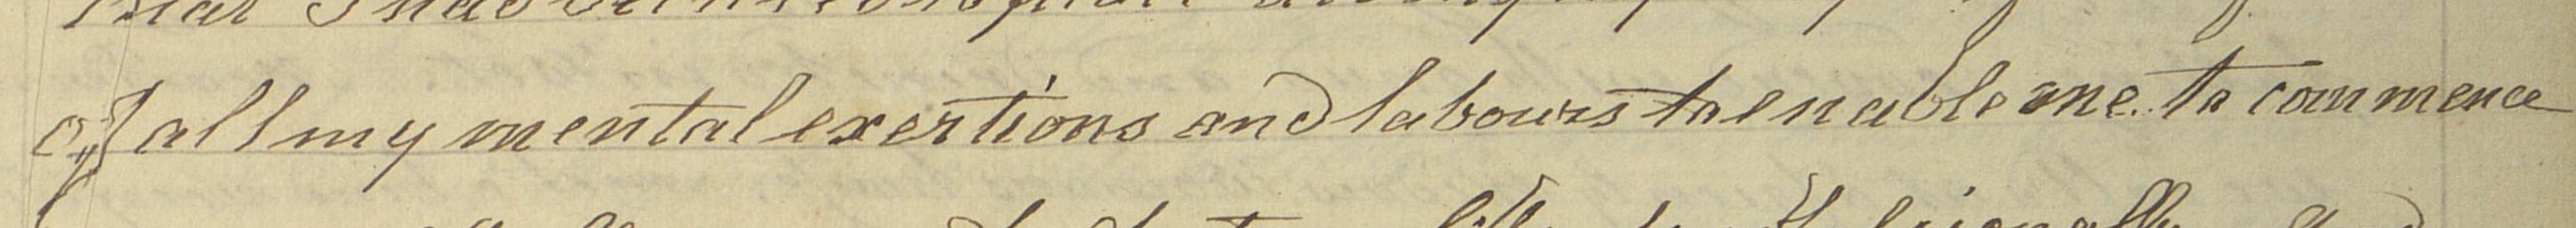of all my mental exertions and labours to enable me to commence
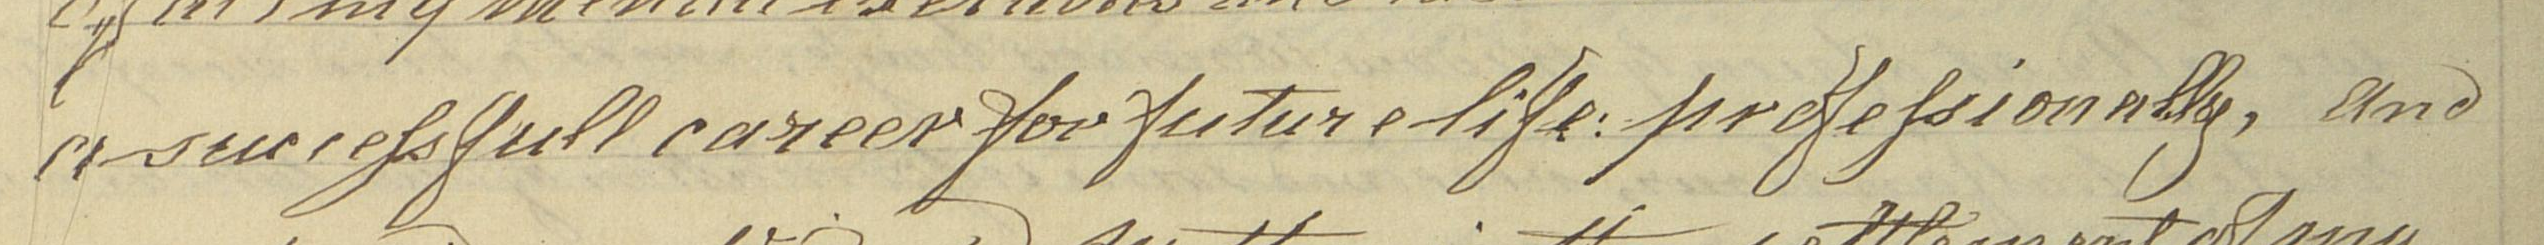a successfull career for future life professionally, and
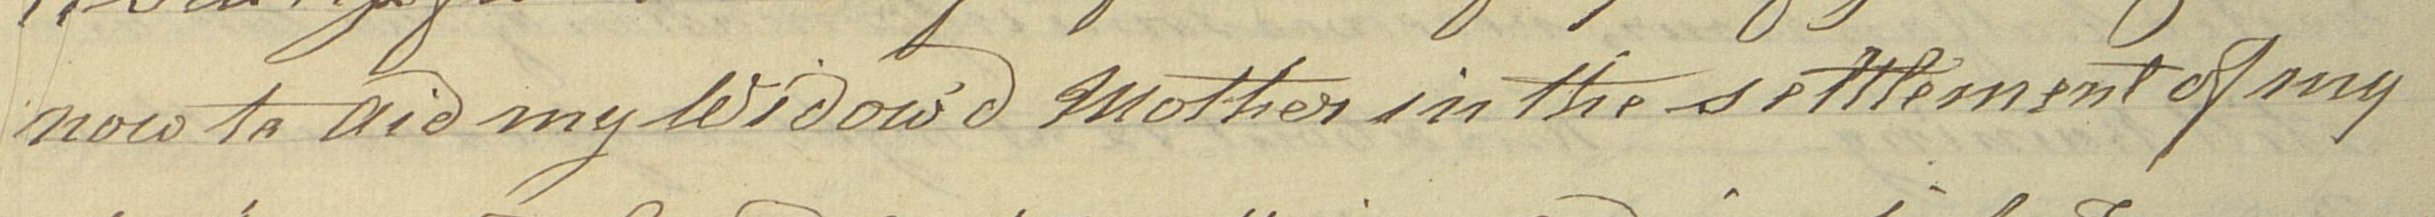now to aid my Widow'd Mother in the settlement of my
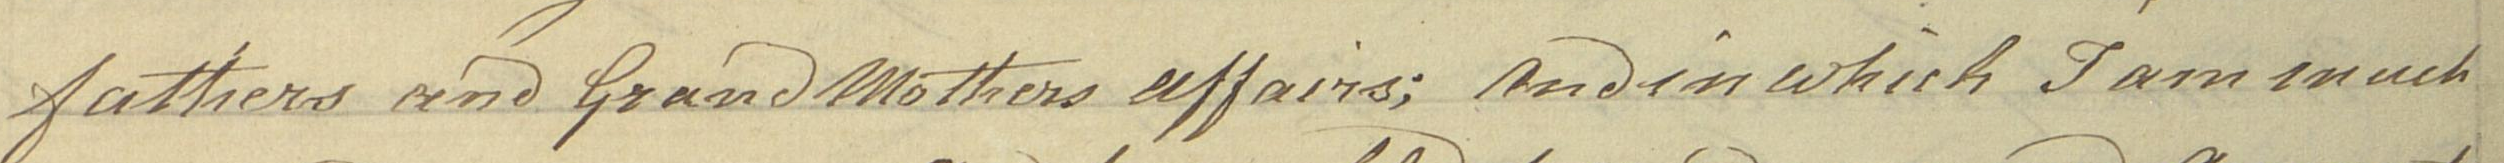fathers and Grand Mothers affairs; and in which I am much
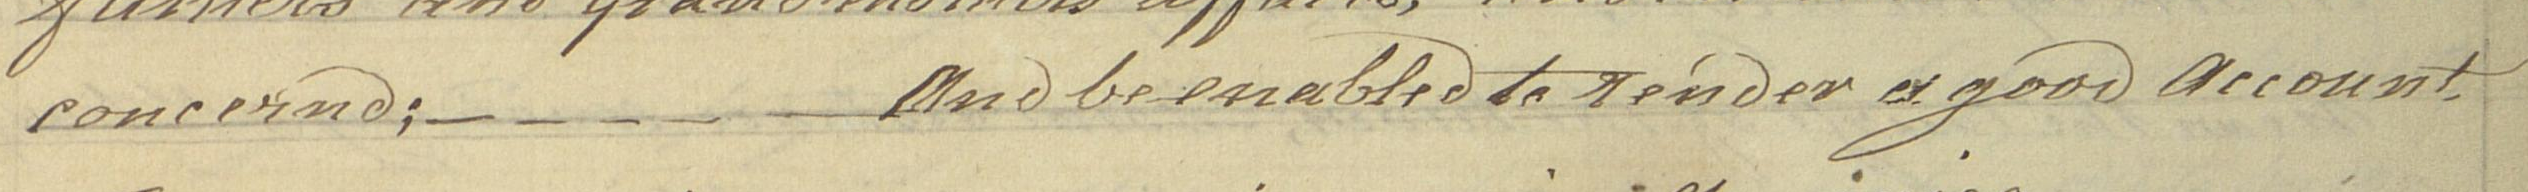concernd; And be enabled to render a good account
